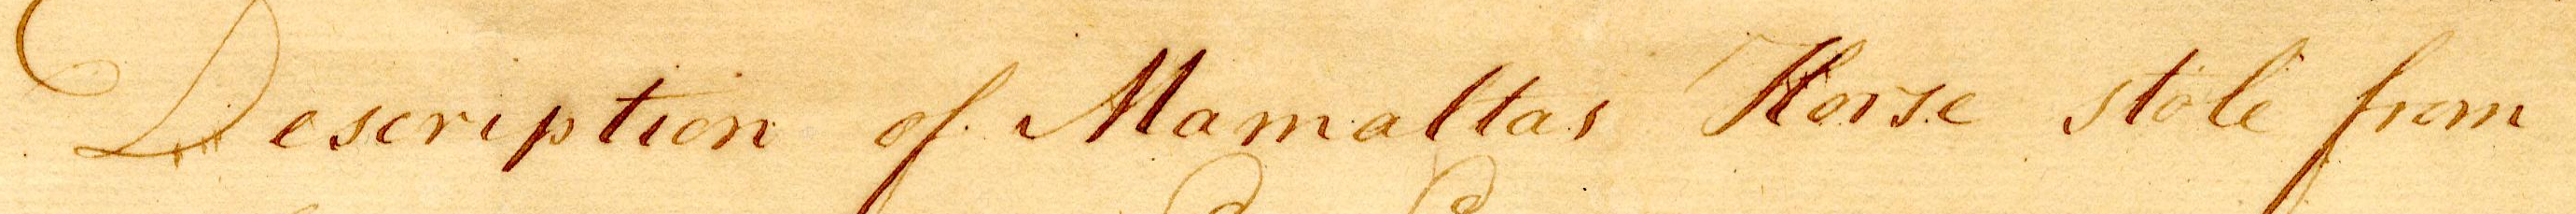Description of Mamaltas Horse stole from
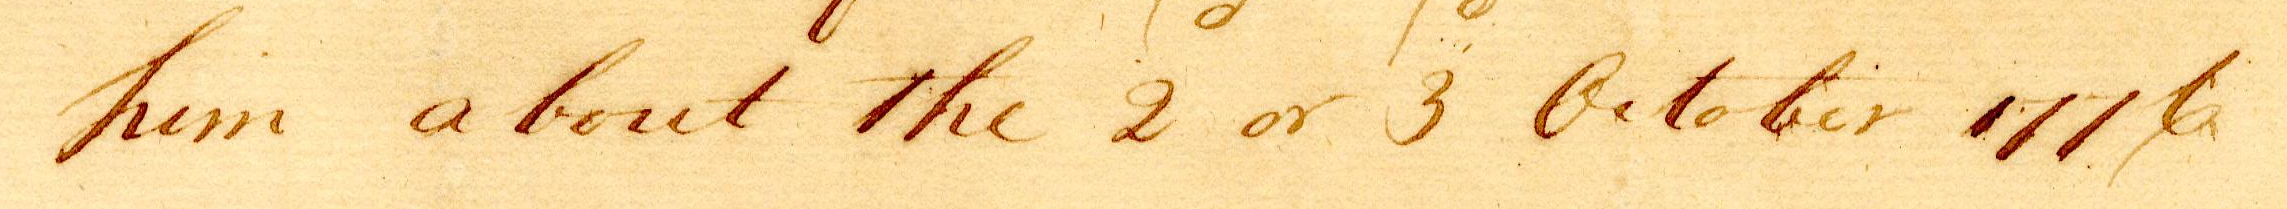him about the 2^d or 3^d October 1776
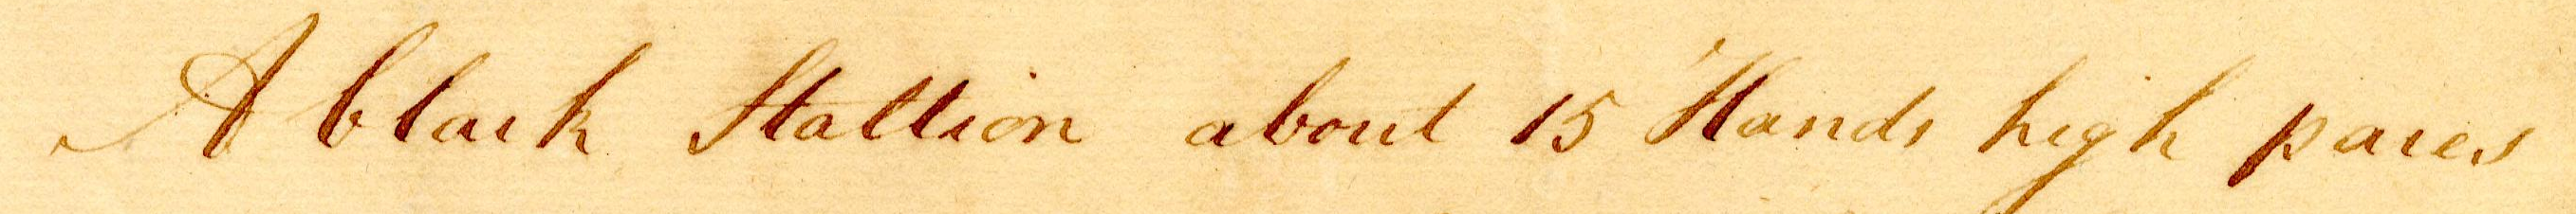A black Stallion about 15 Hands high paces
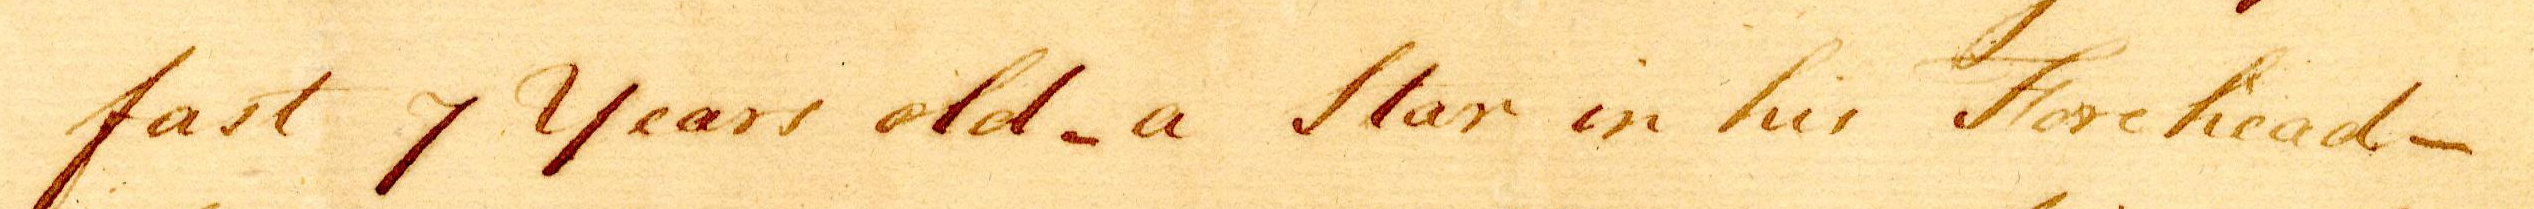fast 7 Years old, a Star in his Forehead-
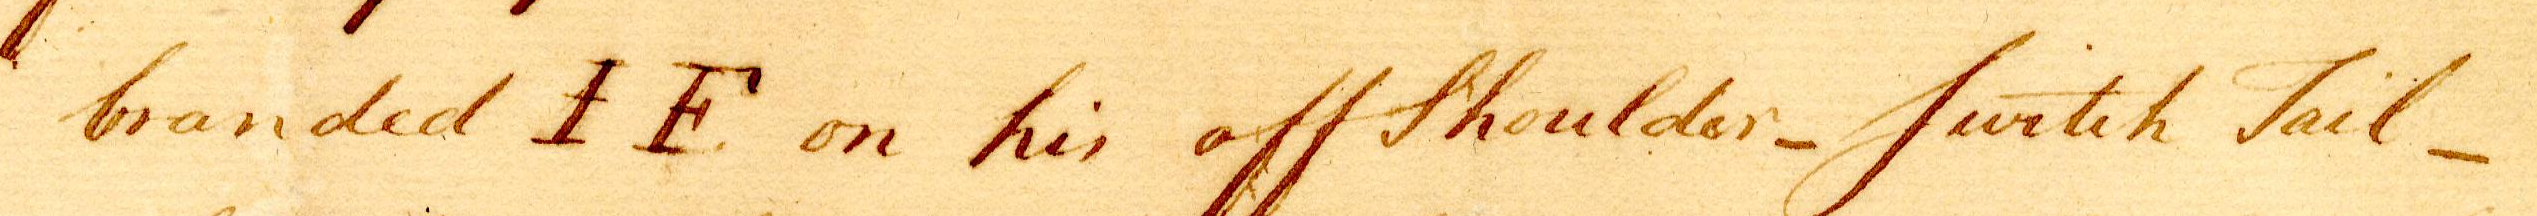branded I.F. on his off Shoulder, Switch Tail,
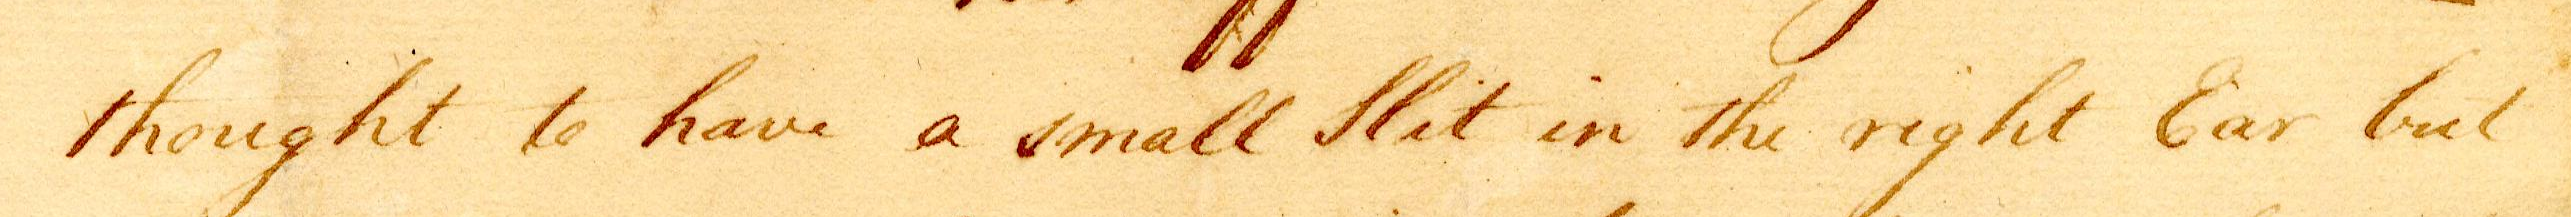thought to have a small Slit in the right Ear, but
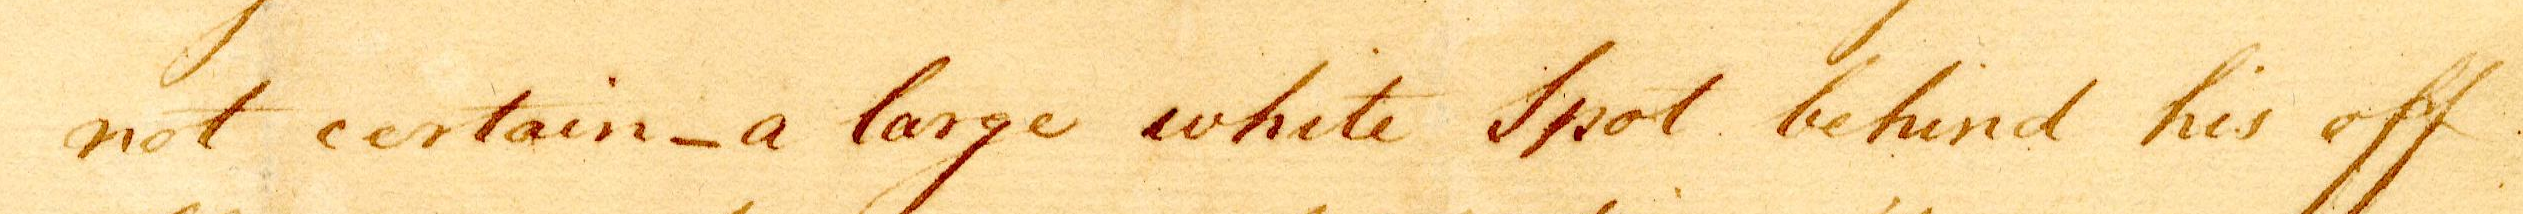not certain, a large white Spot behind his off
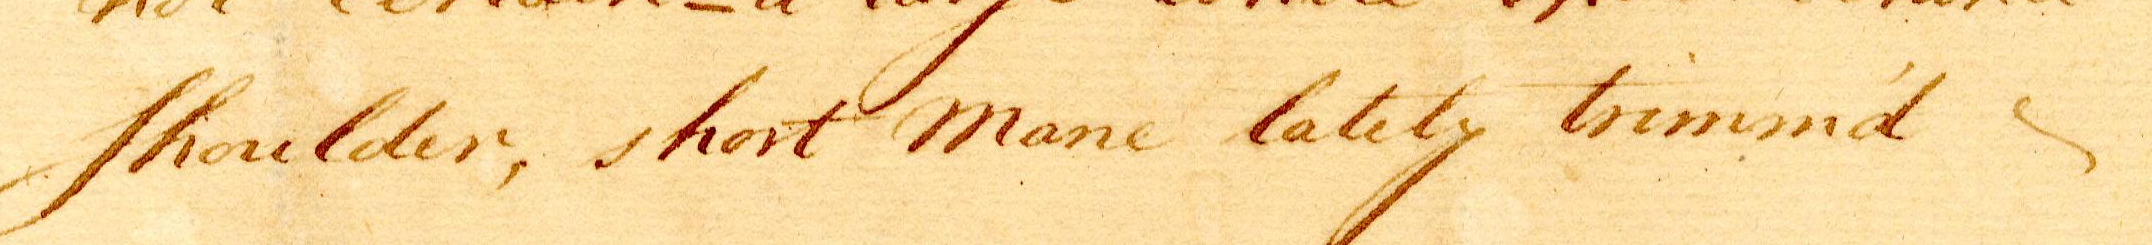Shoulder, short mane lately trimm'd.
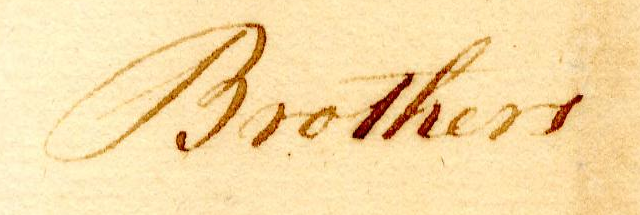Brothers
